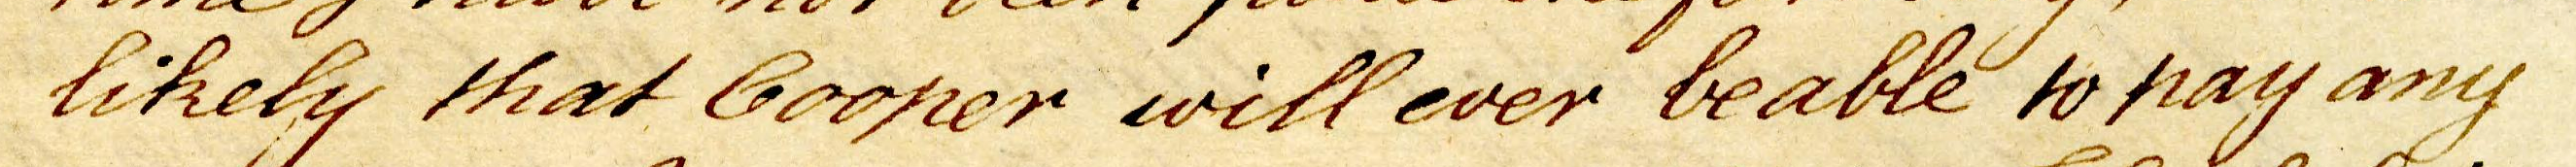likely that Cooper will ever be able to pay any
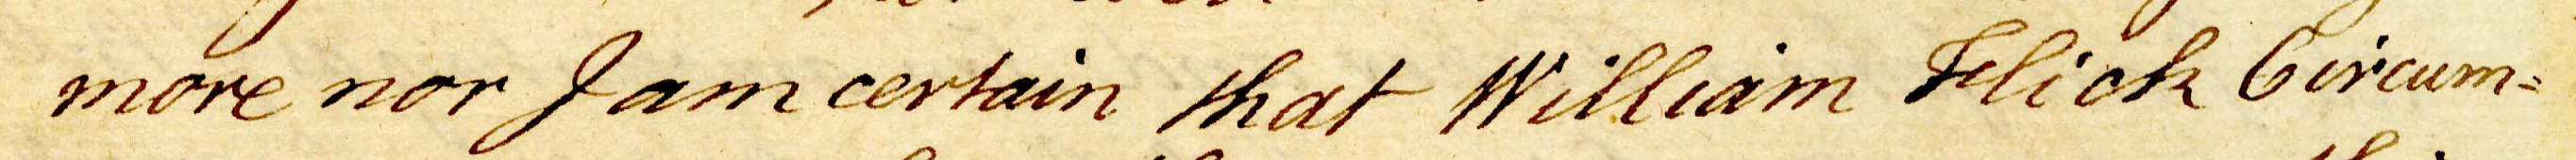more no I am certain that William Flick Circum-
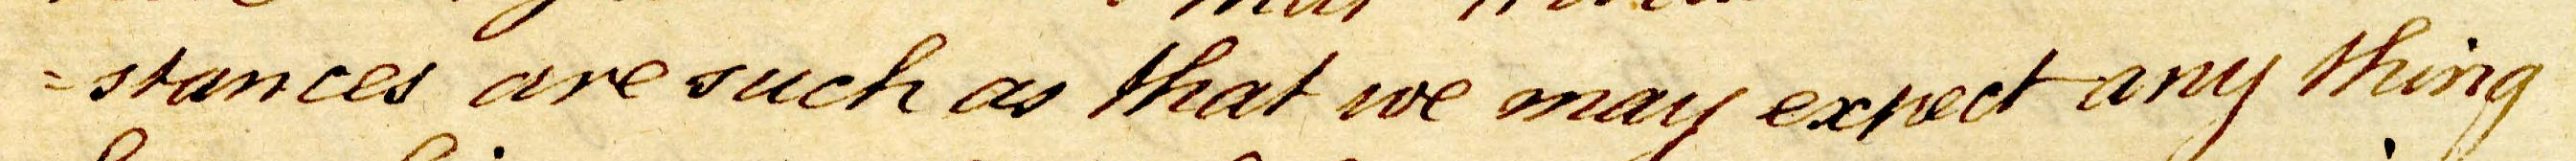-stances are such as that we may expect any thing
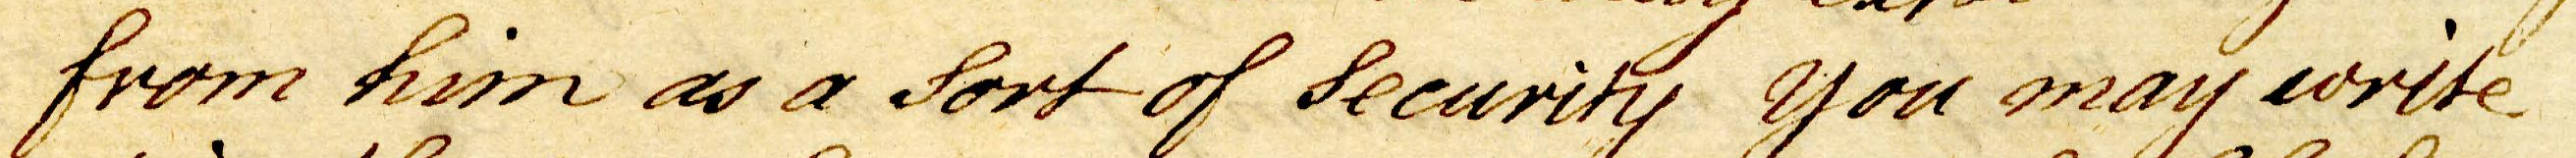from him as a Sort of Security, You may write
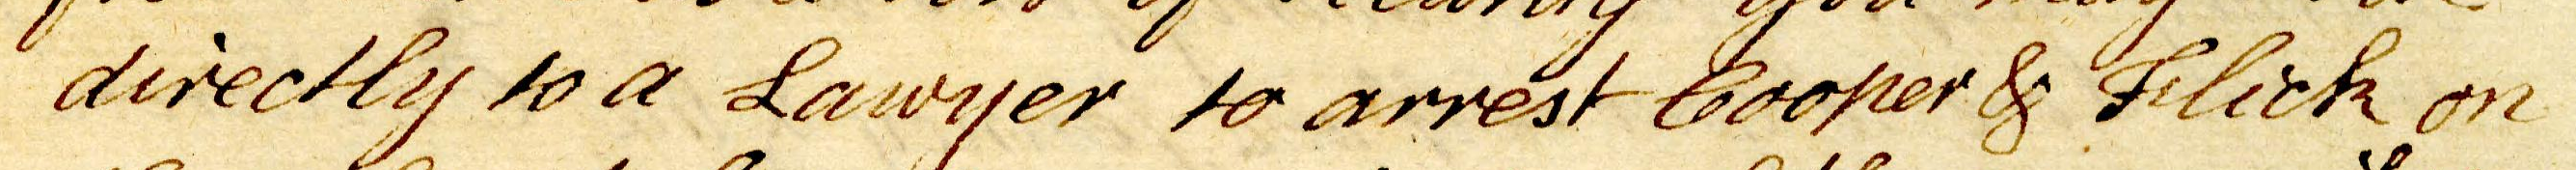directly to a Lawyer to arrest Cooper & Flick on
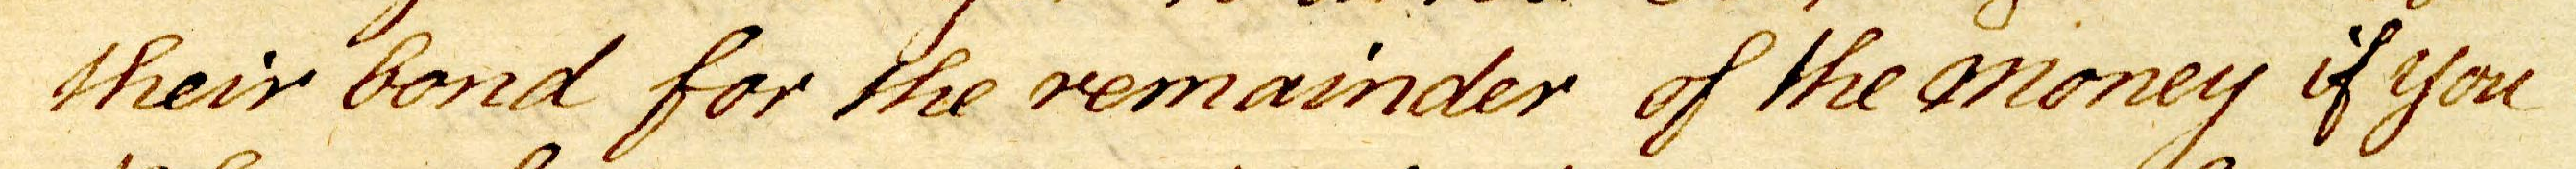their bond for the remainder of the Money if You
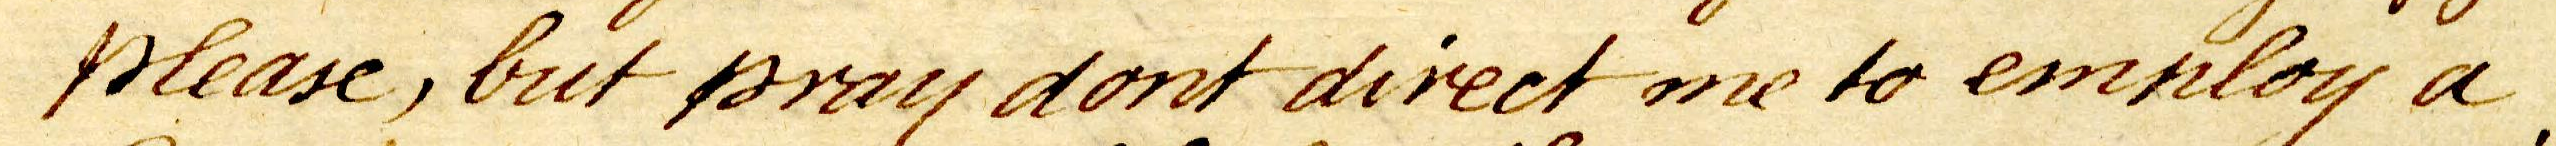Please, but pray dont direct me to employ a
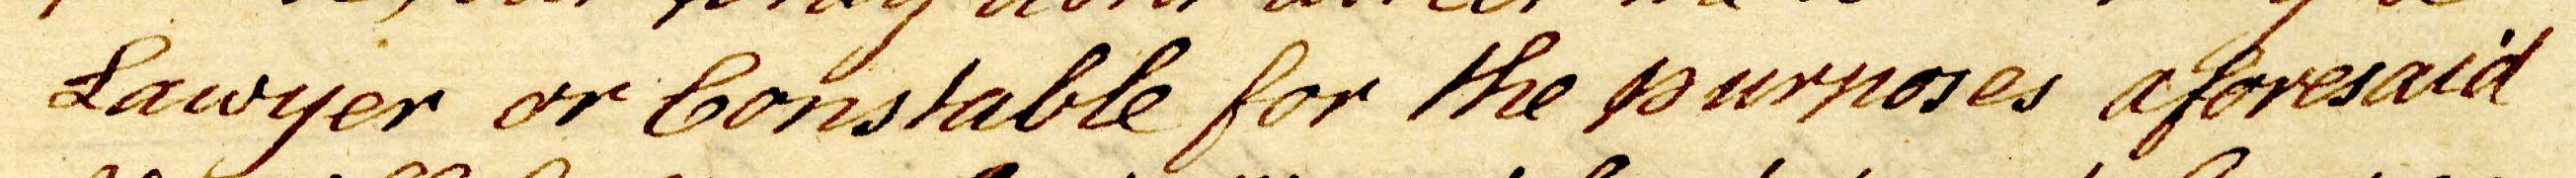Lawyer or Constable for the purposes aforesaid
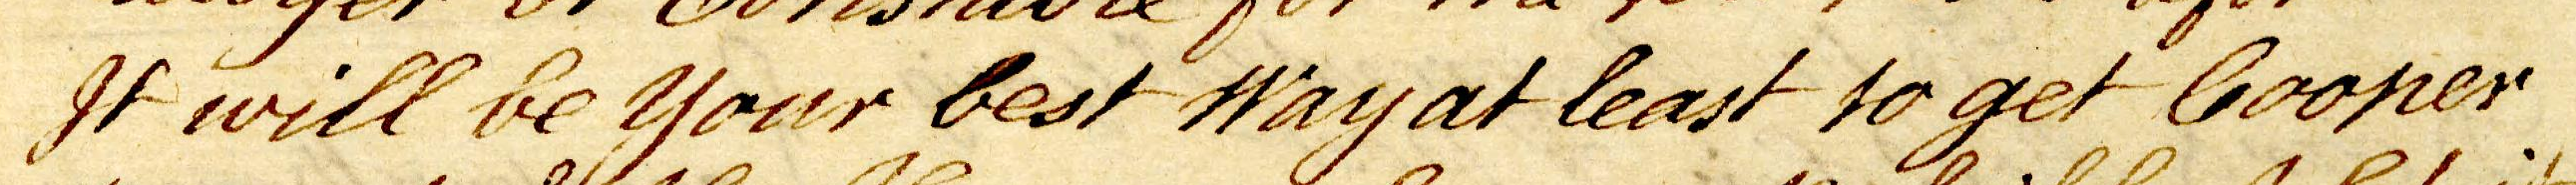It will be Your best Way at least to get Cooper
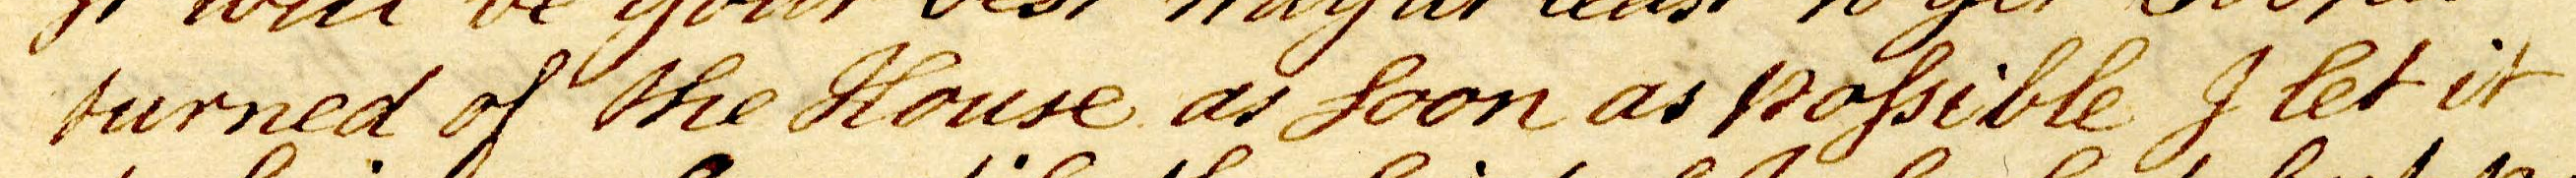turned of the House as Soon as possible I let it
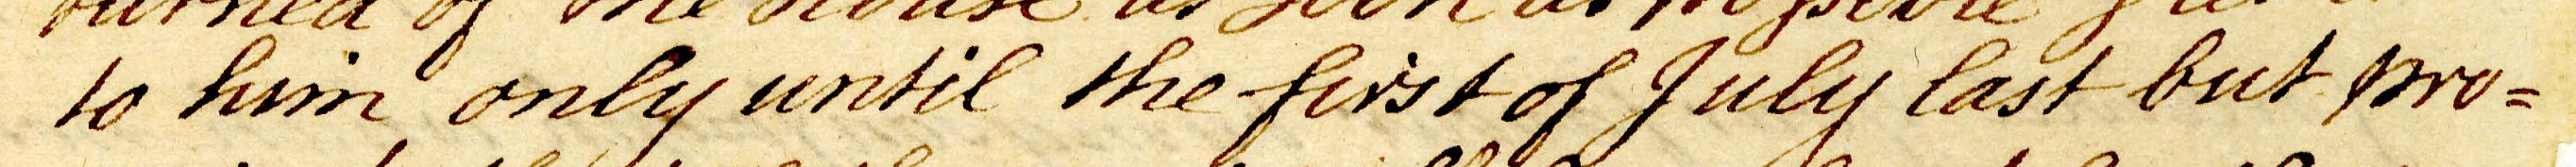to him only until the first of July last but pro-
